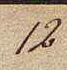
12
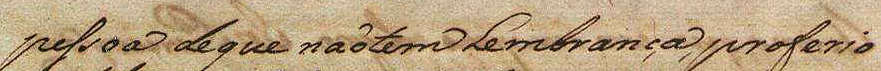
pessoa de que naõ tem Lembrança, proferio
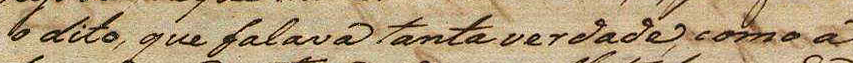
o dito, que falava tanta verdade, como a
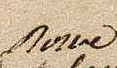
Desse
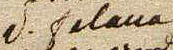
q̄ falaua
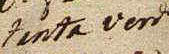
tanta verd.e
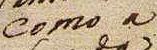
como a
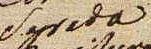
Sagrada
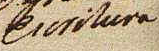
Escritura
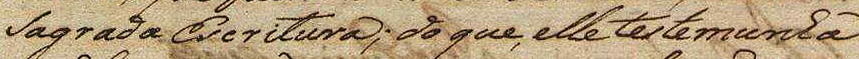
sagrada Escritura; do que elle testemunha
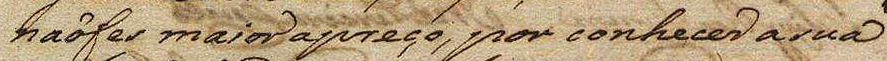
naõ fes maior apreço, por conhecer a sua
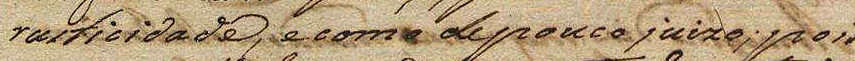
rusticidade, e como de pouco juizo; pois
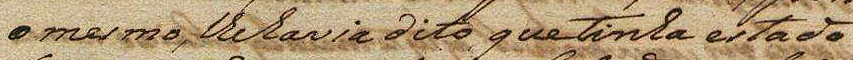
o mesmo, lhe havia dito que tinha estado
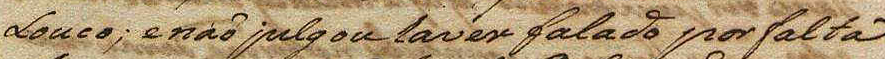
Louco; e naõ julgou haver falado por falta
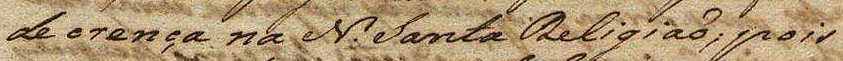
de crença na N. Santa Religiaõ; pois
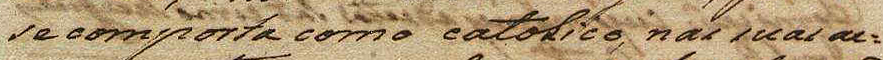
se comporta como catolico, nas suas ac
